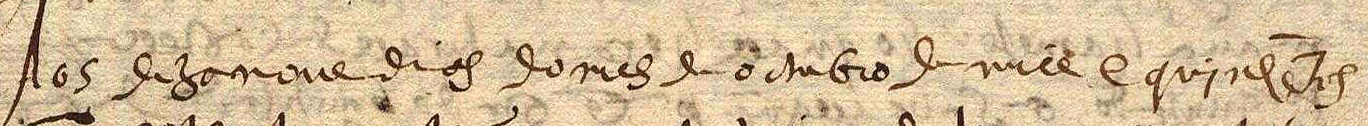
Aos dezanoue dias do mes de octubro de mill e qujnhētos
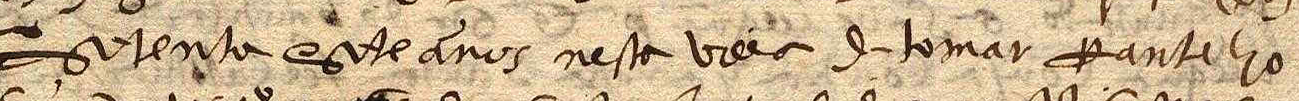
E setenta e sete anos nesta villa de tomar ꝑante ho
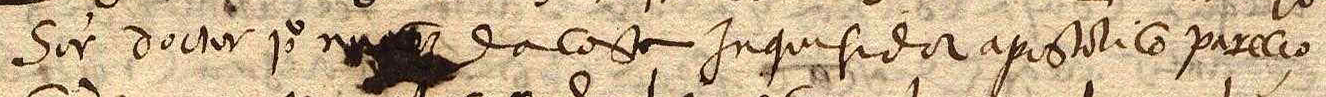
Sor̄ doctor po nunez da costa Jnquisidor apostolico pareçeo
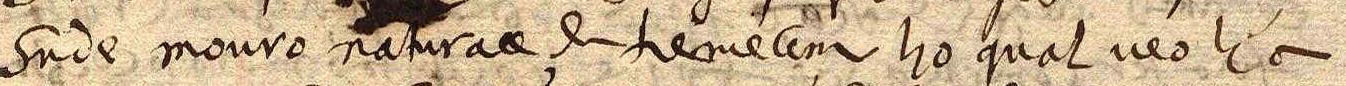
Sude mouro naturall de tremeçem ho qual ueo ha
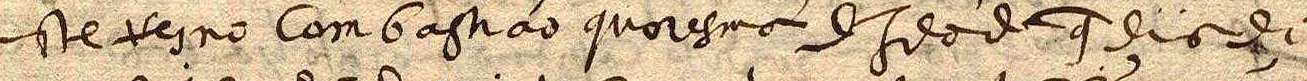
ste Rejno com bastião quaresma de Jdade q̄ dise di
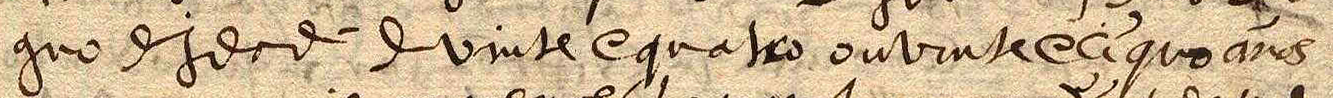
guo de jdade de vinte e quatro ou vinte e çīquo anos
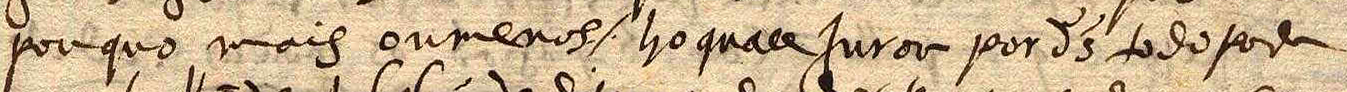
pouquo mais ou menos /. ho quall Jurou por ds̄ todo pode
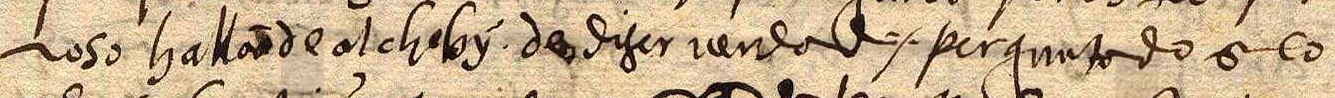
roso hallā de alchebȳ de diser uerdade /. perguntado se co
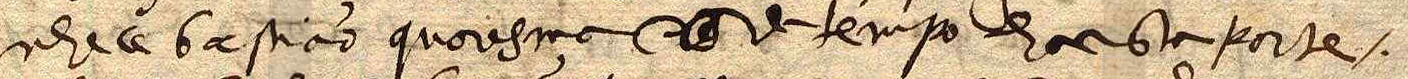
nheçe bastiaõ quaresma e q̄ de tempo ha esta parte /.
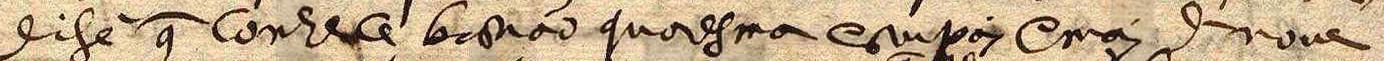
dise q̅ conheçe bastiaõ quaresma e seu paj e maj de noue
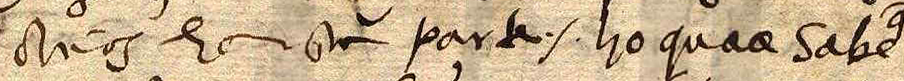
Anōs ha esta parte./. ho quall sabe
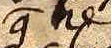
q̄ he
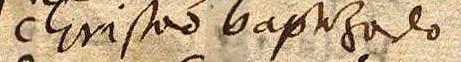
christaõ baptizado
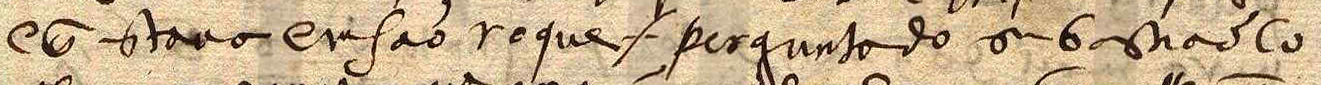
e q̄ estaua em saõ roque ./. perguntado se bastiaõ co
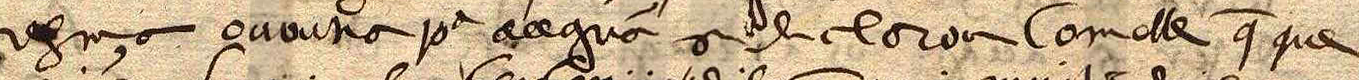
resma ou outra pa allguā se declarou Com elle q̄ que
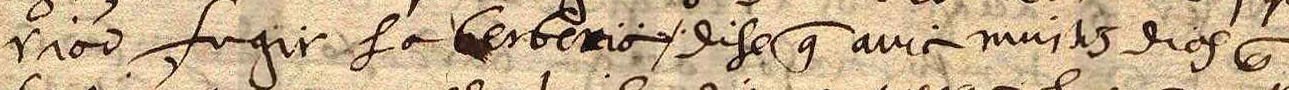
riaõ fugir ꝑa berberia / dise q̄ auia muitos dias q̄
